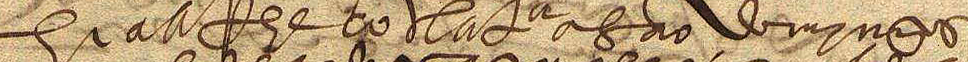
hia a Rhe cō ela ta a são domjngos
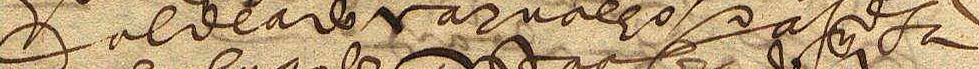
daldea do carualho / e a Jḡeja
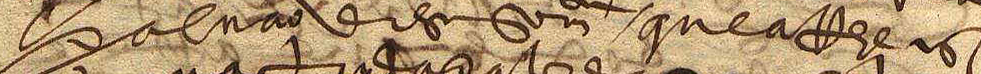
e al não dise somte / que a Rhe es
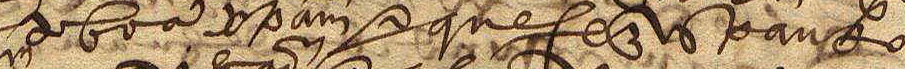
mto boa xpam̄ e que fez espanto
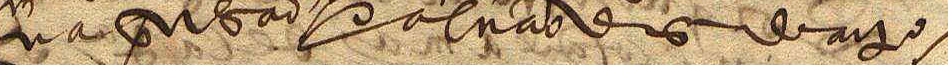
sua prisaõ / e al não dise do arto /
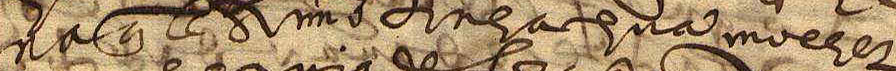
naq̄le Anno tinha huā molher
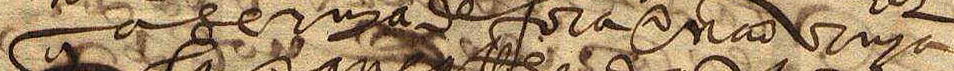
q̄ a seruja de fora e não viuja
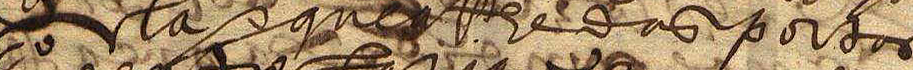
cō ela e que a Rhe das portas
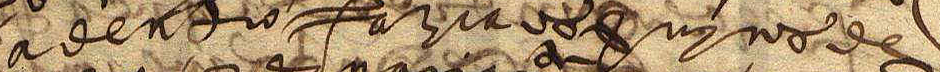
adentro fazia os ꞩujços de
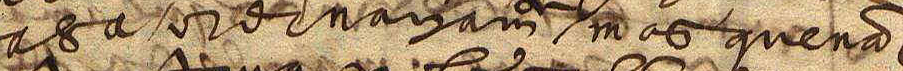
casa / ordinariamte / mas que não
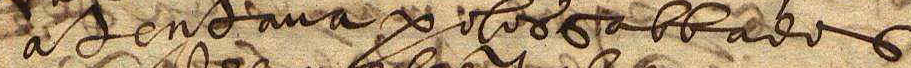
atentaua polos sabbados
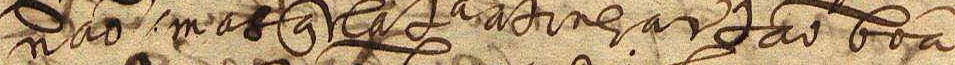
naõ /. mas q̄ ela ta a tinha ē tão boa
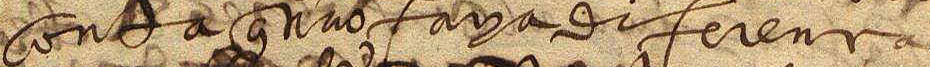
conta q̄ não farja diferença
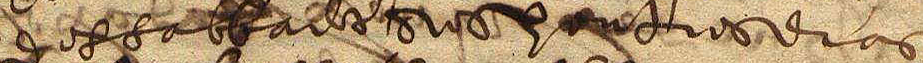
dos sabbados Aos houtros dias
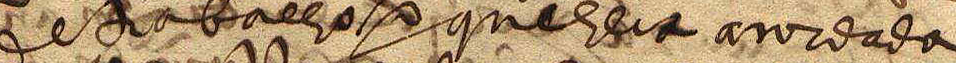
de trabalho / e que hera acordada
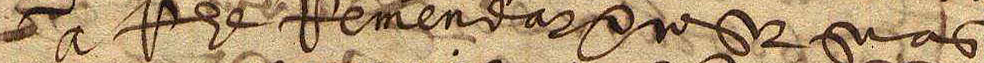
a Rhe Remendar e coser suas
